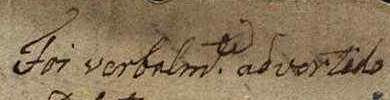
Foi verbalm.te advertido
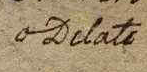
o Delato
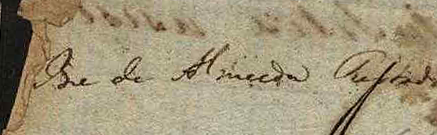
Joze de Almeida Furtado
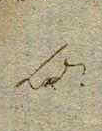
Lxa.
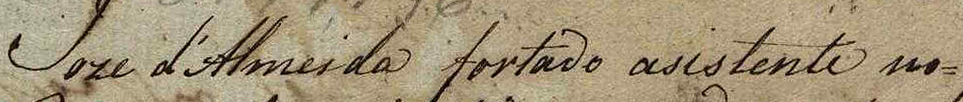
Ioze d'Almeida fortado asistente no
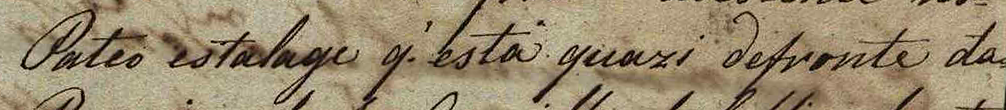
Pateo estalage q̄ esta quazi defronte da
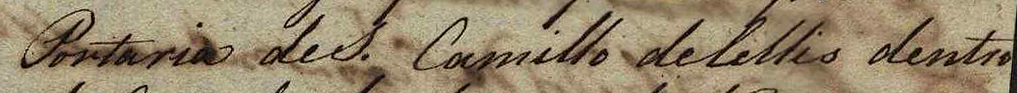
Portaria de S. Camillo de Lellis dentro
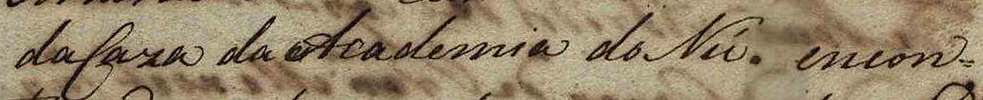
da Caza da Academia do Nú encon
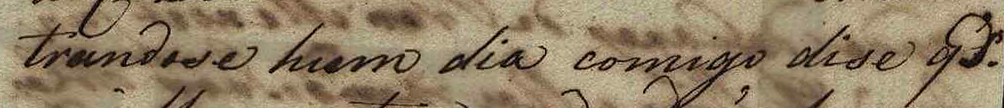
trandose hum dia comigo dise q̄ se
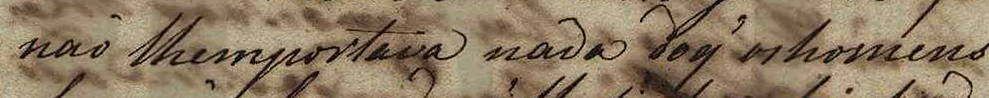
naõ lhemportava nada do q̄ os homens
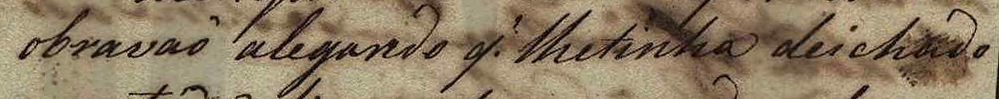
obravaõ alegando q̄ lhe tinha deichado
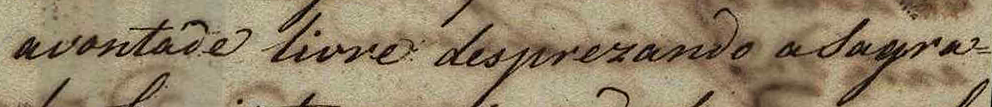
a vontade livre, desprezando a Sagra
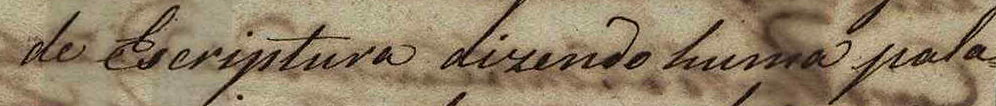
de Escriptura dizendo huma pala
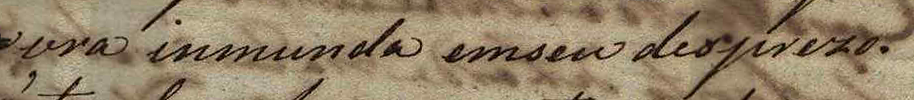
vra inmunda em seu desprezo
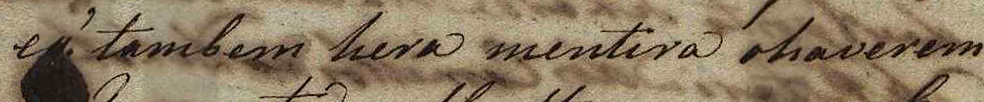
e _ tambem hera mentira o haverem
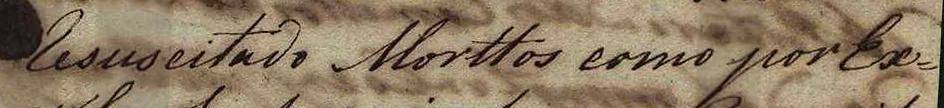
Resuscitado Morttos como por Ex
